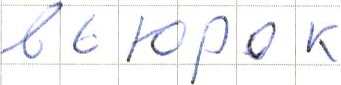вьюрок
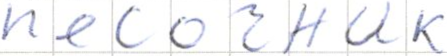песочник
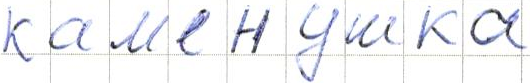каменушка
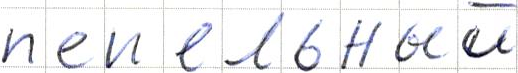пепельный
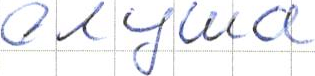олуша
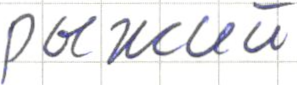рыжий
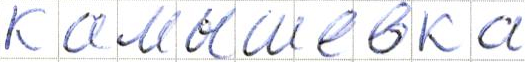камышевка
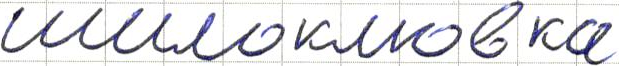шилоклювка
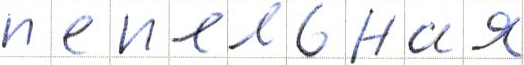пепельная
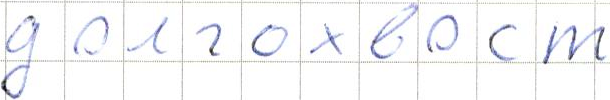долгохвост
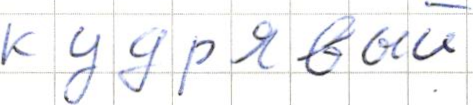кудрявый
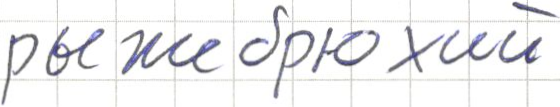рыжебрюхий
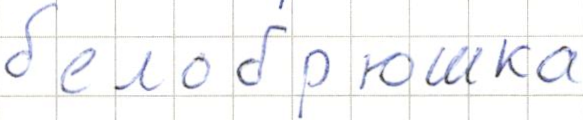белобрюшка
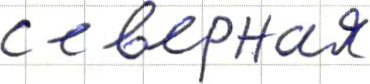северная
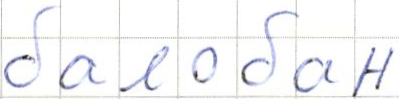балобан
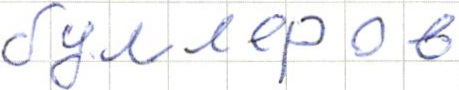буллеров
